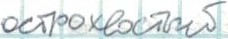острохвостый
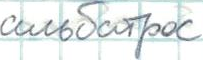альбатрос
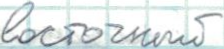восточный
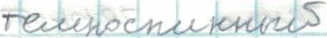темноспинный
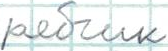рябчик
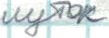луток
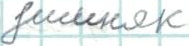зимняк
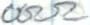сыч
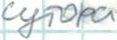сутора
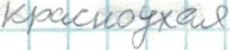красноухая
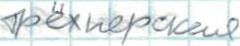трехпёрская
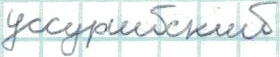уссурийский
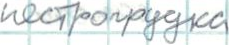пестрогрудка
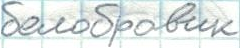белобровик
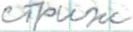стриж
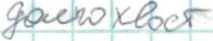долгохвост
